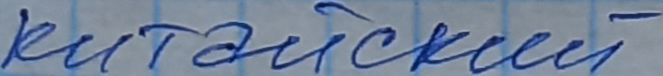китайский
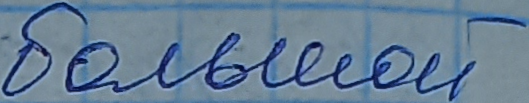большой
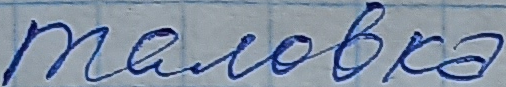таловка
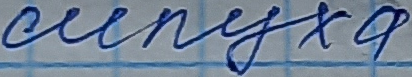сипуха
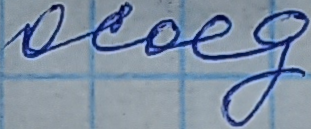осоед
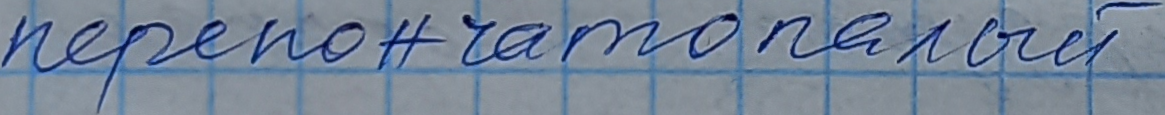перепончатопалый
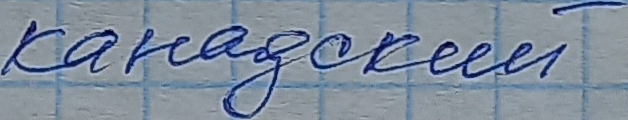канадский
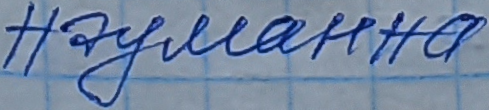науманна
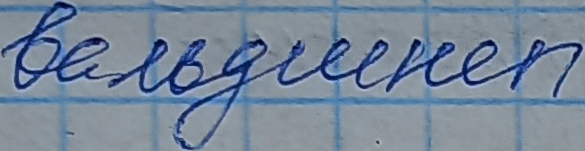вальдшнеп
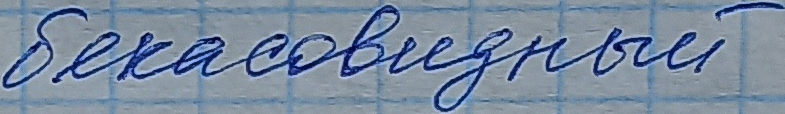бекасовидный
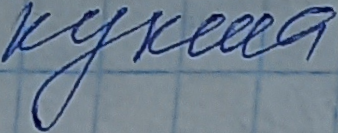кукша
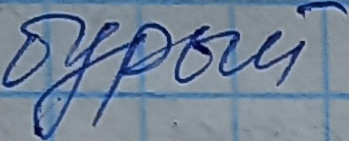бурый
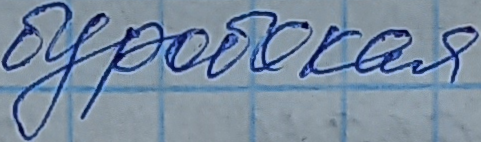буробокая
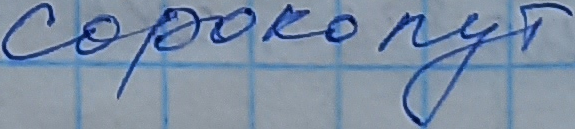сорокопут
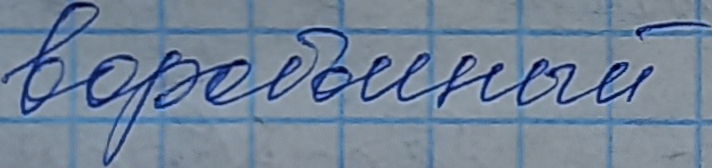воробьиный
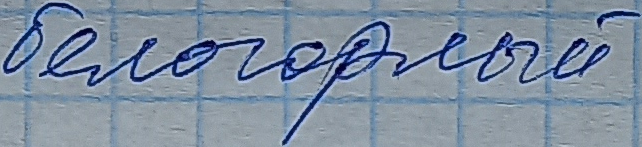белогорлый
